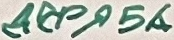деряба
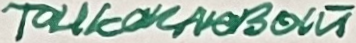тонкоклювый
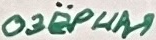озёрная
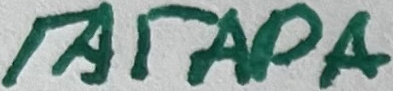гагара
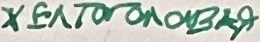желтоголовая
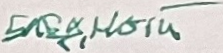бледный
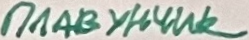плавунчик
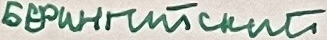берингийский
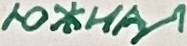южная
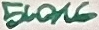бюль
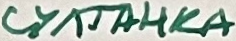султанка
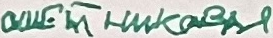ошейниковая
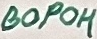ворон
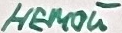немой
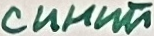синий
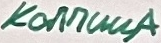колпица
